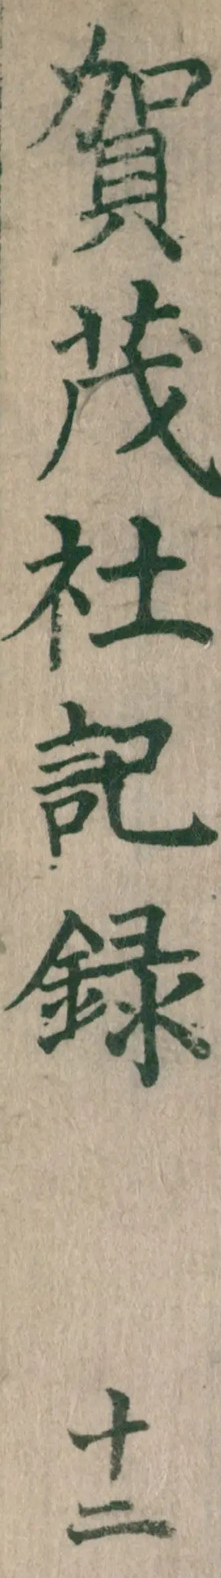賀茂社記録十二

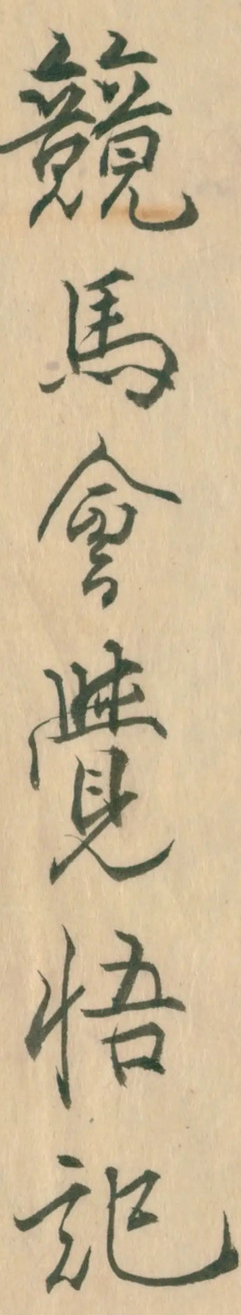競馬会覚悟記

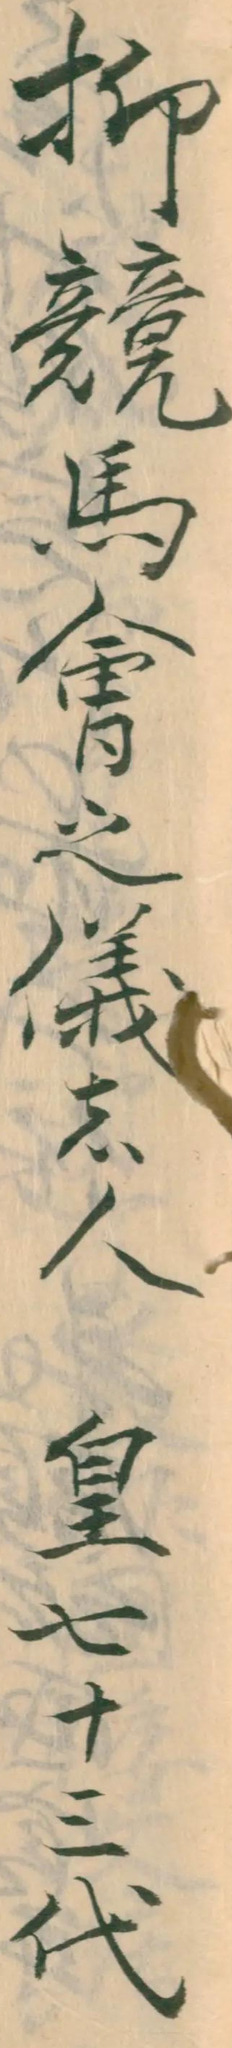抑競馬会之儀は人皇七十三代
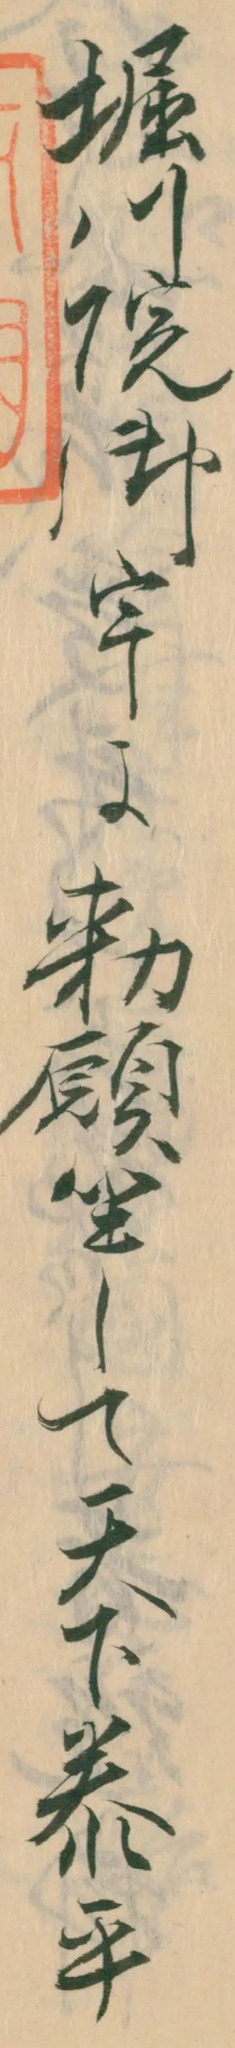堀川院御宇に勅願坐して天下泰平
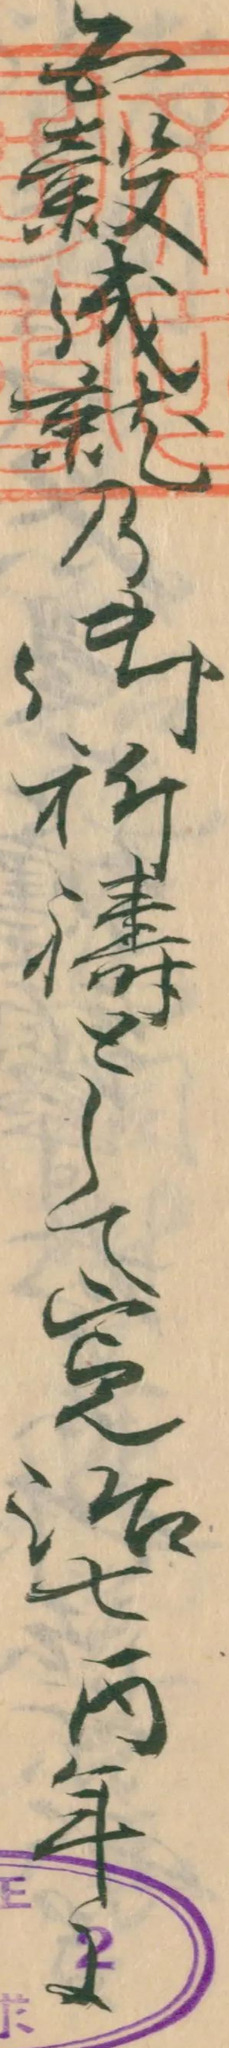五穀成就の御祈祷として寛治七丙年に
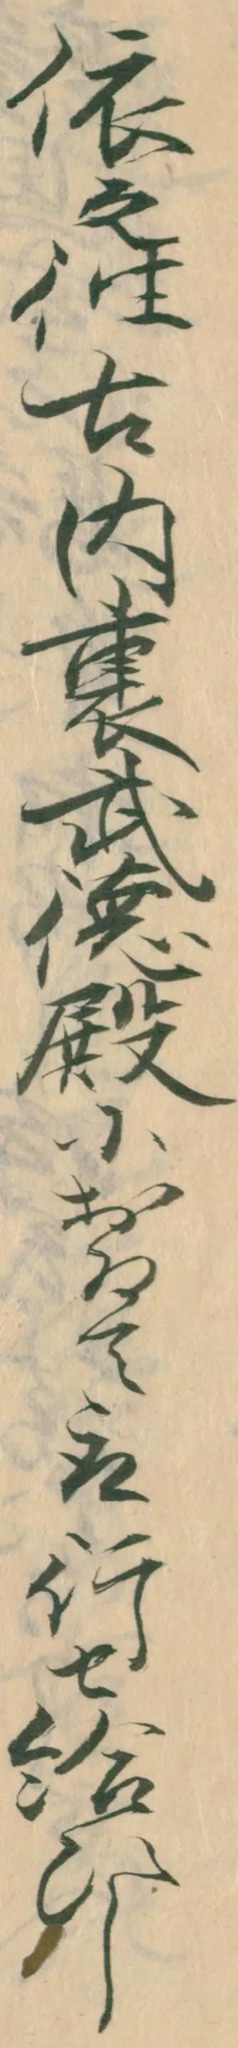依之往古内裏武徳殿におゐて取行せ給ひし
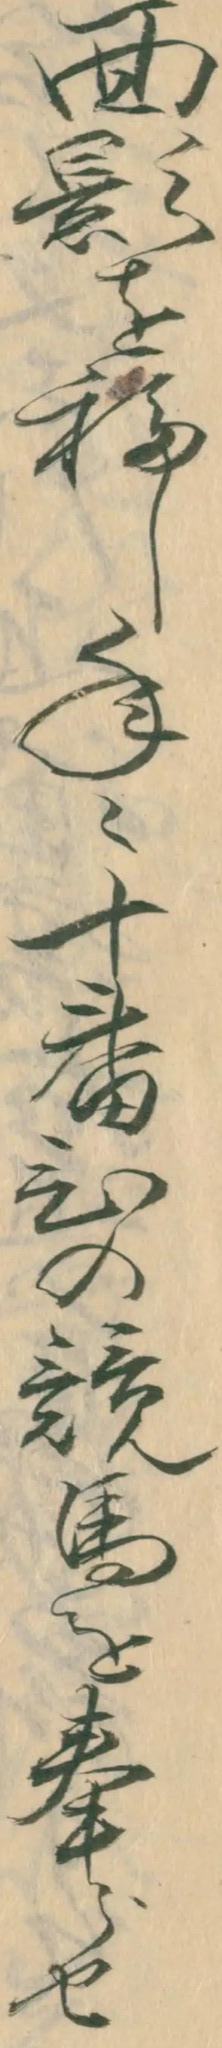面影を移し年々十番飛の競馬を奉らせ

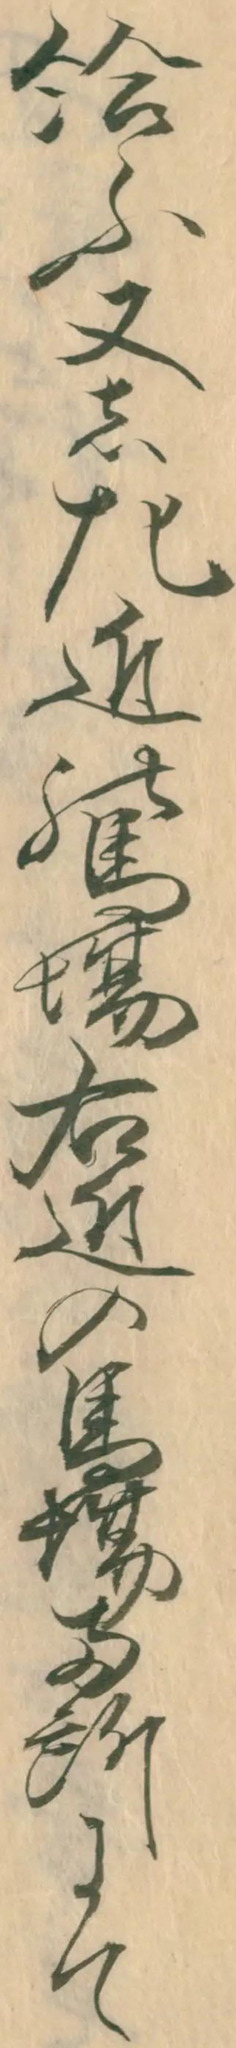給ふ又は左近の馬場右近の馬場両所にて
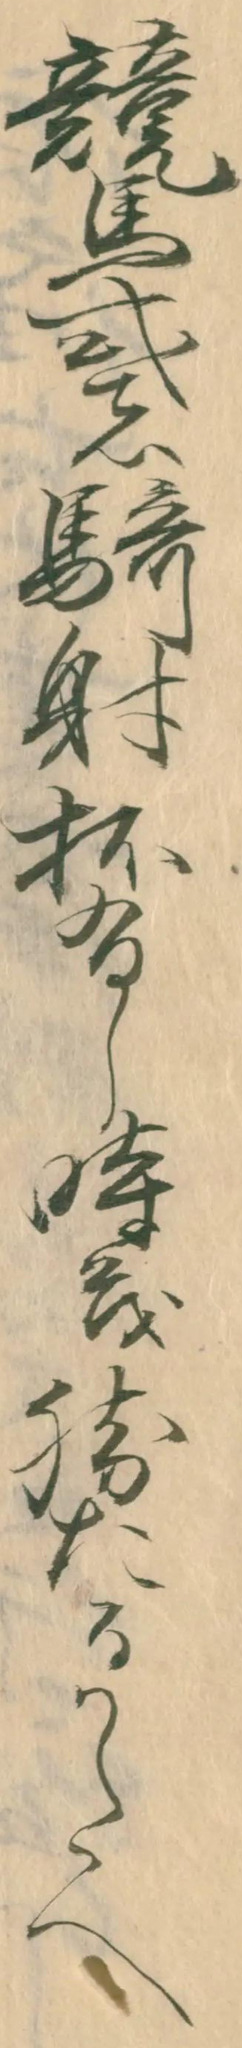競馬或は騎射抔有し時も勝たるかたへ
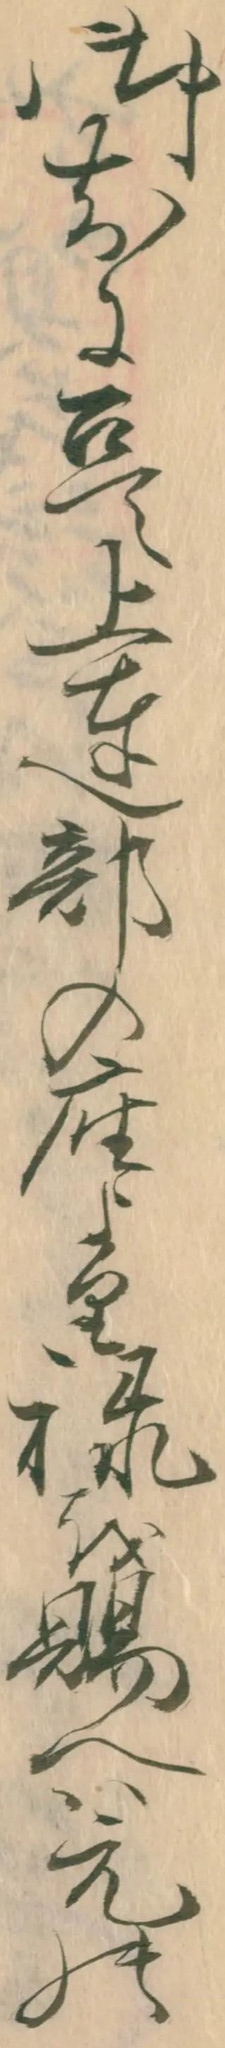御前に召て上達部の座より禄を賜へは元の
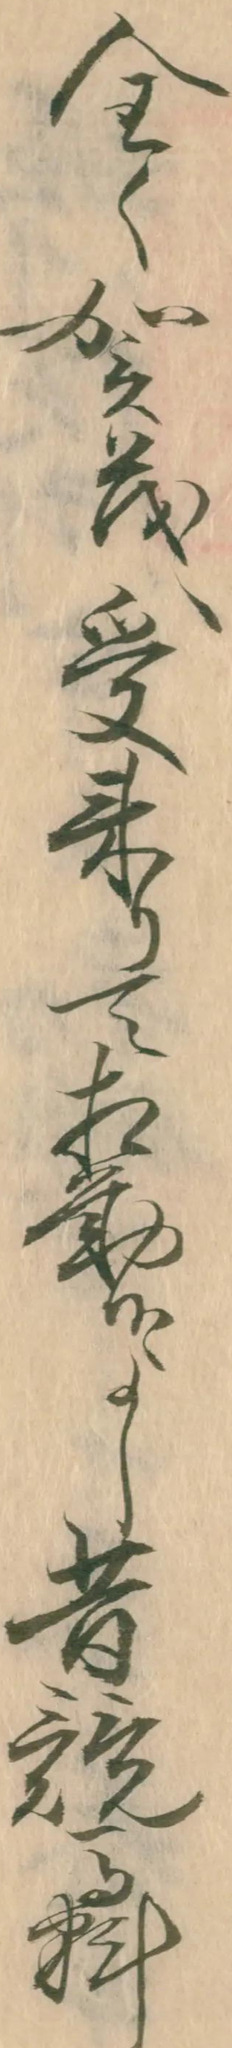全く賀茂受来りて相勤候よし昔競馬料
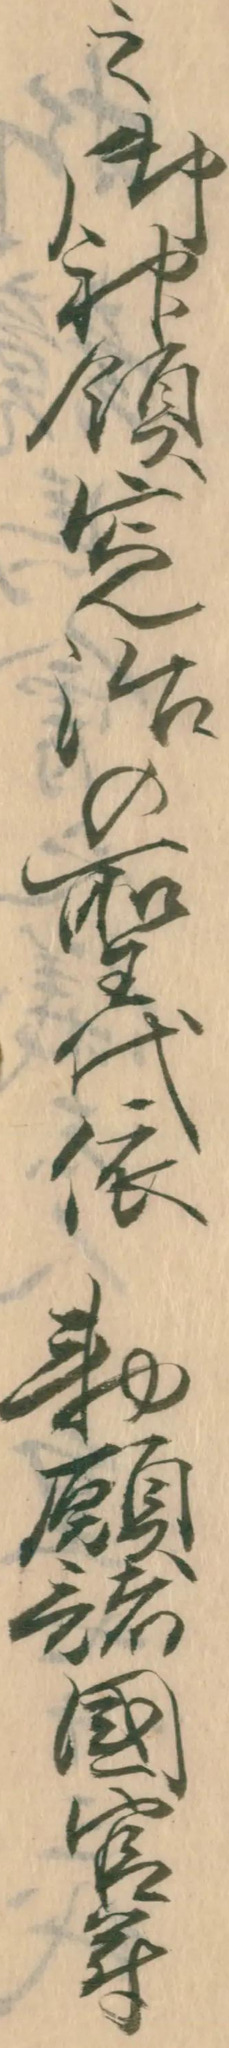之御神領寛治の聖代依勅願諸国官等
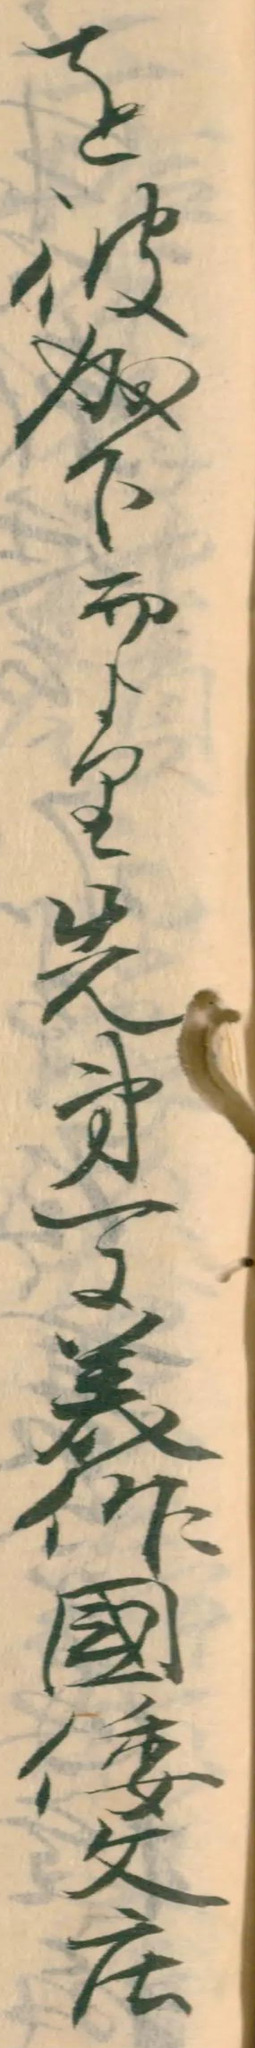を被成下而より先第一に美作国倭文庄
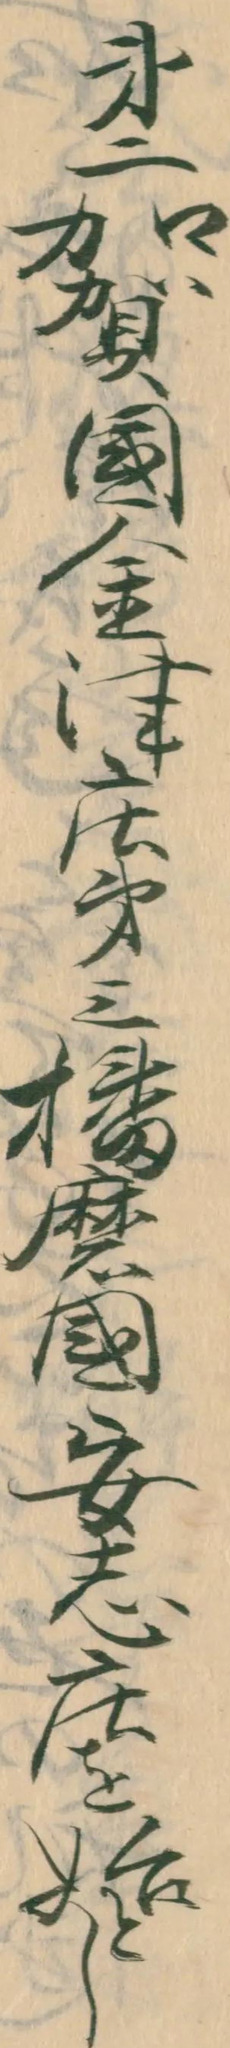第二加賀国金津庄第三播磨国安志庄を始とし
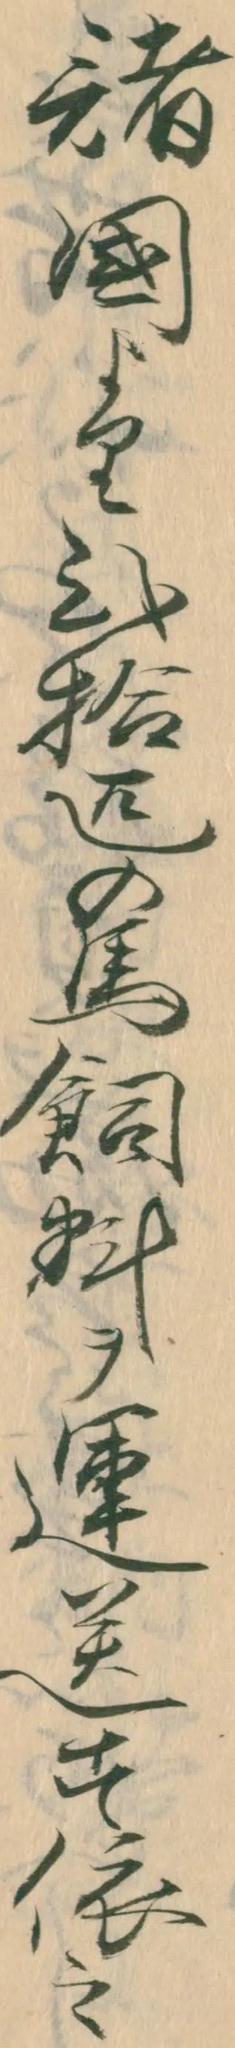諸国より弐拾匹の馬飼料を運送す依之
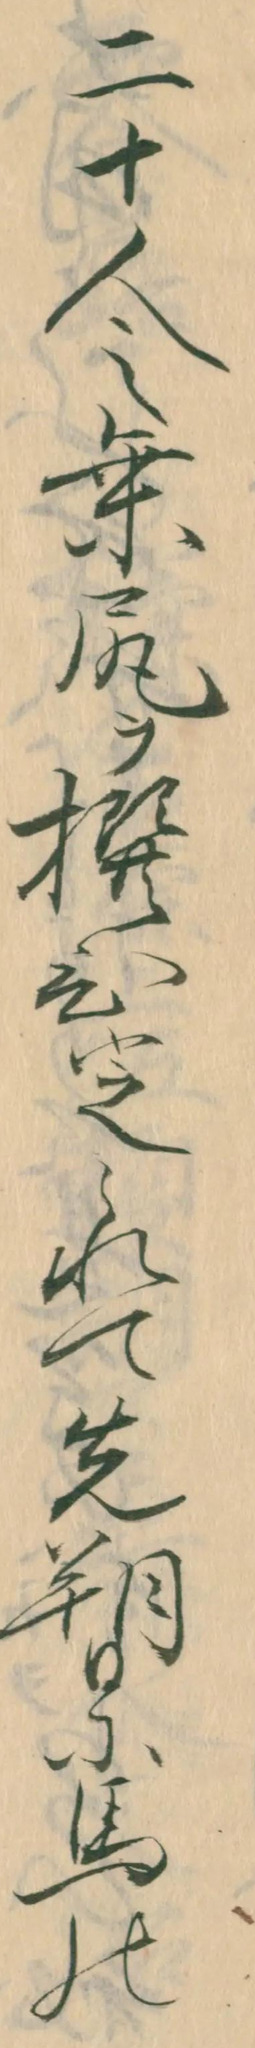二十人之乗尻を撰ひ定られて先朔日に馬の
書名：賀茂社記録. 第12冊
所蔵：国立国会図書館 National Diet Library, JAPAN
